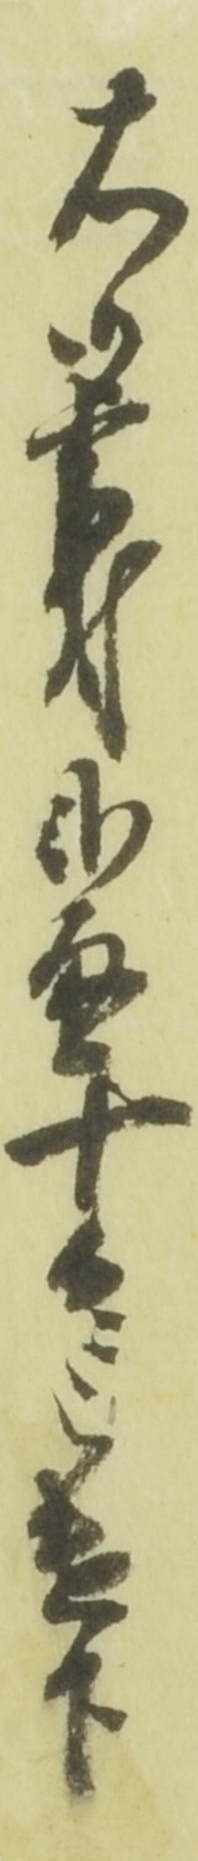右御書付弐通十日ニ被遣下
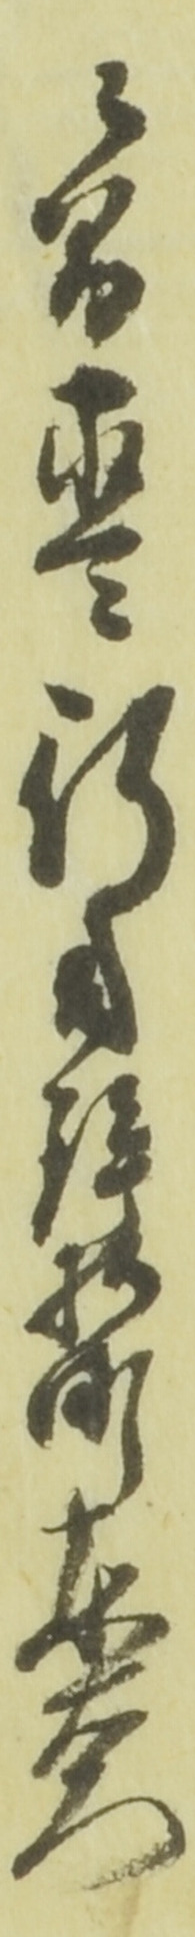候間直ニ行司鉾持町東右衛門
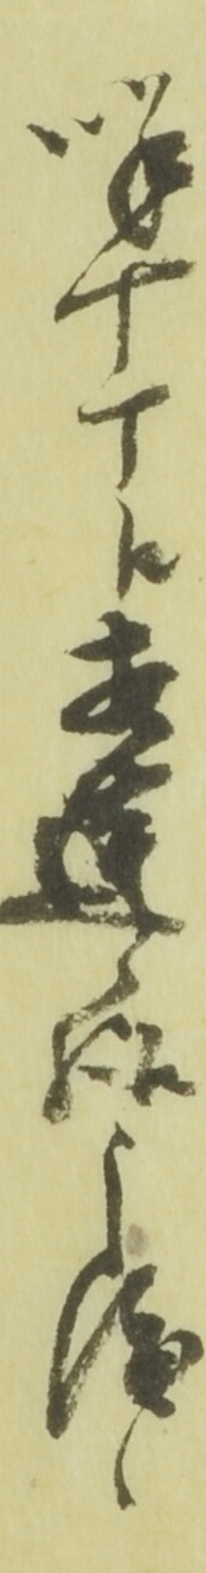呼十丁江相達候様申渡候

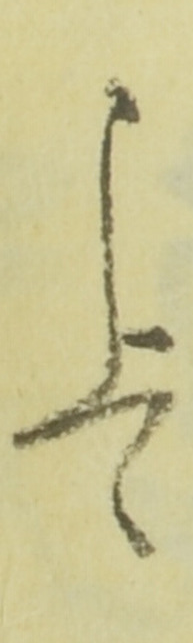申上候
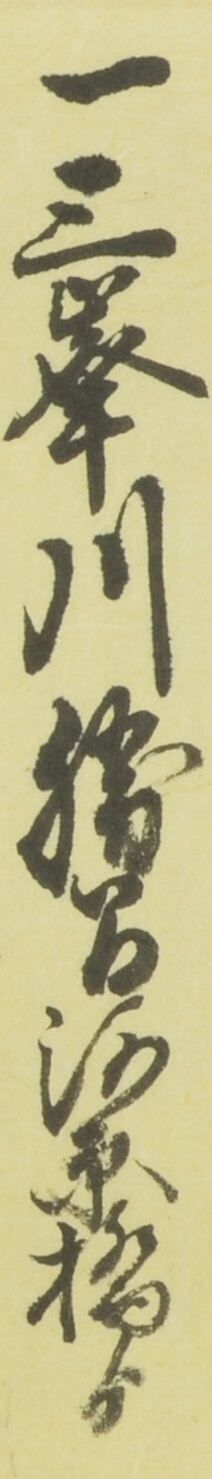一三峯川勝間河原橋ゟ
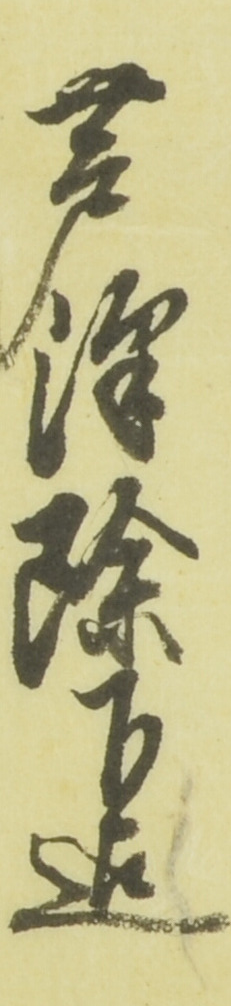芦沢除下迄
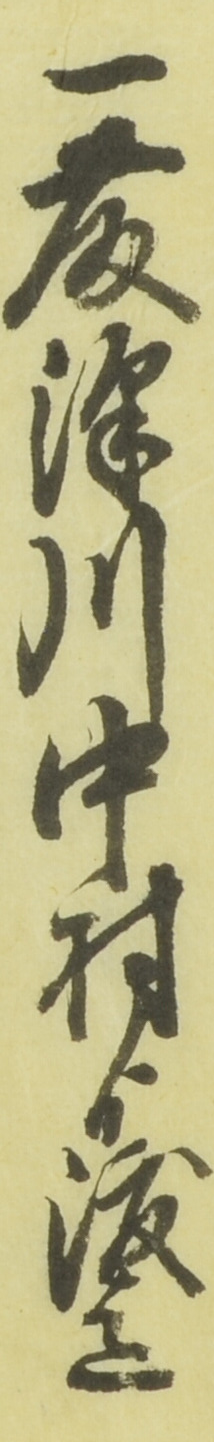一藤沢川中村ゟ渡迄
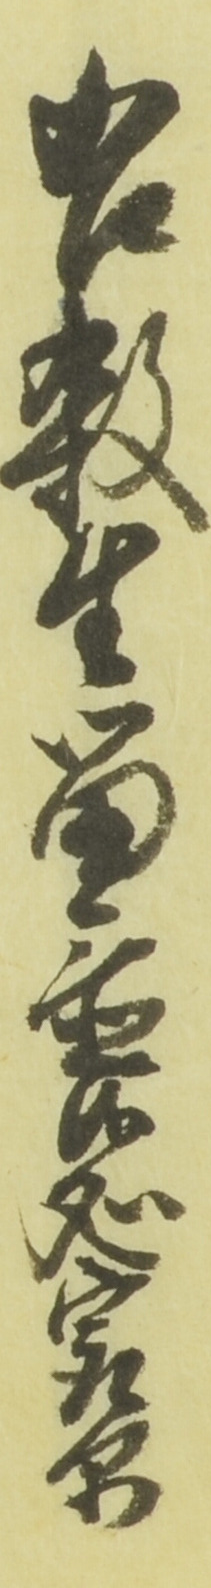右殺生留置候処最早
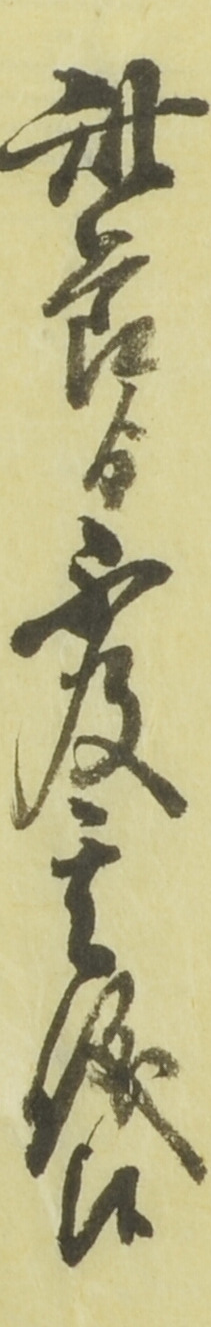此節ゟ不及其儀候
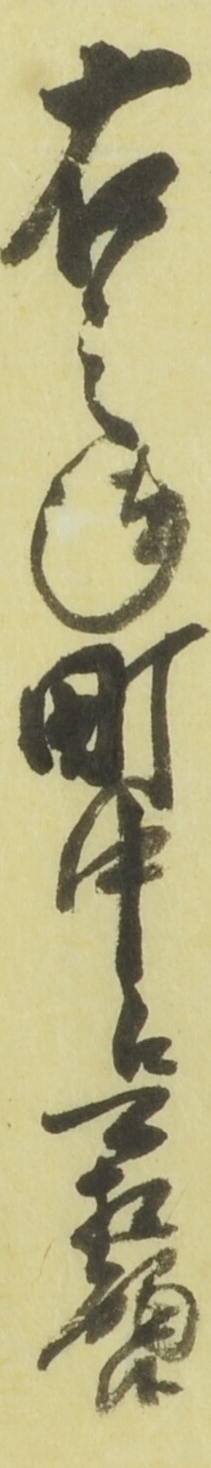右之趣町中江可相触候
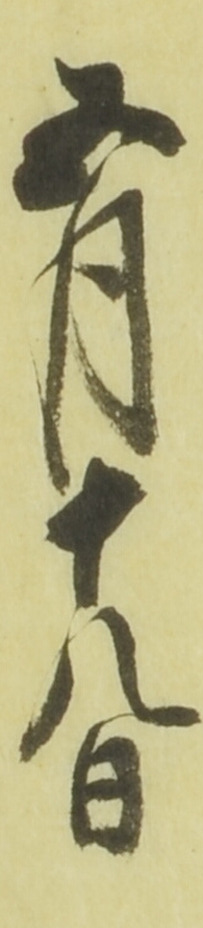五月十八日
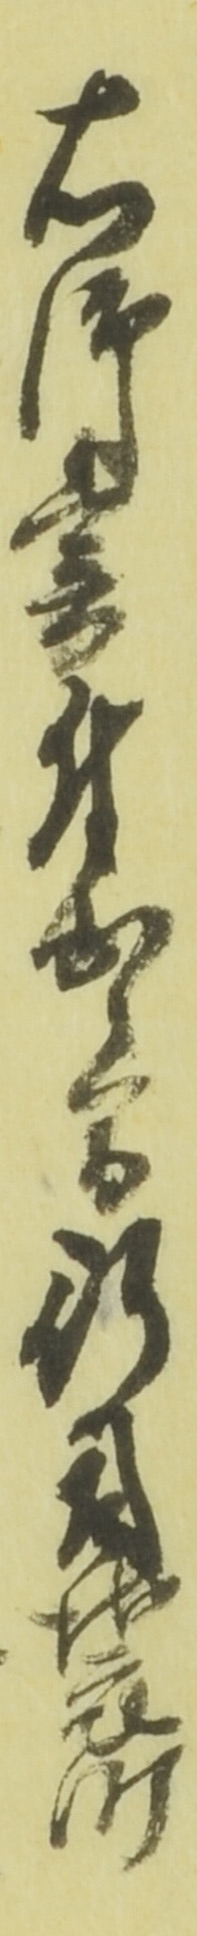右御書付出候間行司袋町
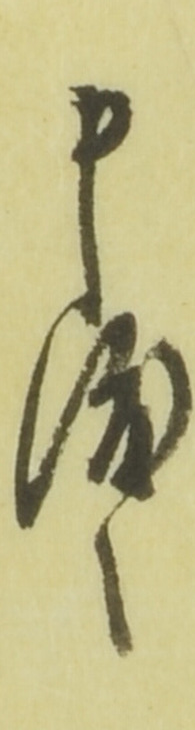申渡候

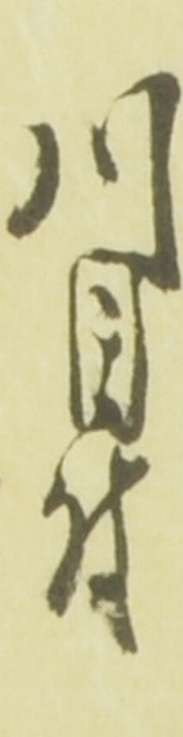川目付
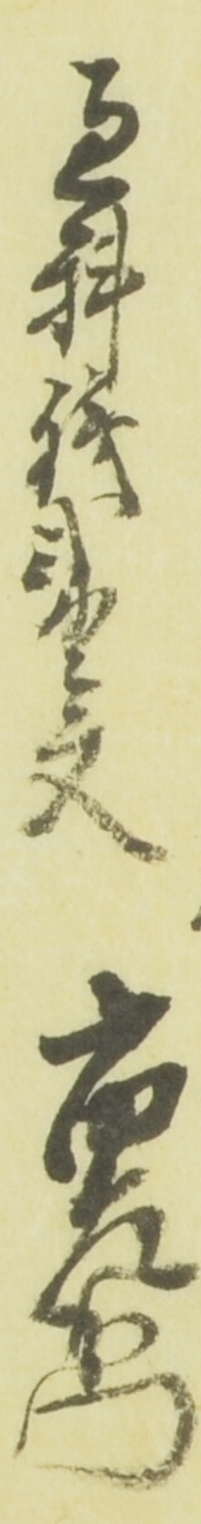過料銭弐貫文市左衛門
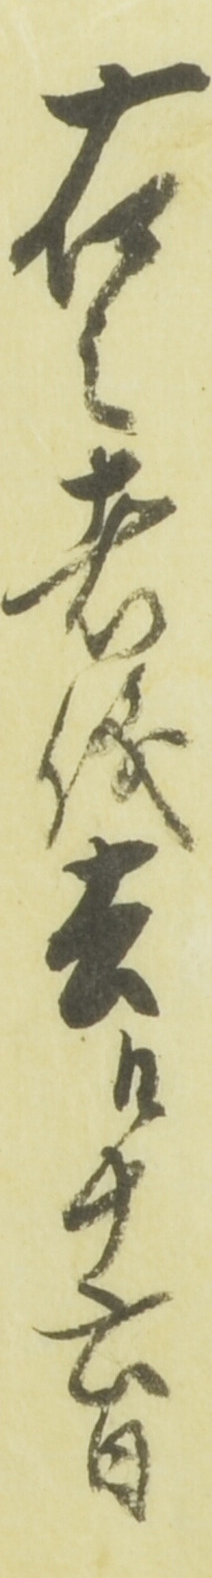右之者儀去ル十六日
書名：御触書御書附控
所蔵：伊那市立高遠町図書館・合同会社AMANE
